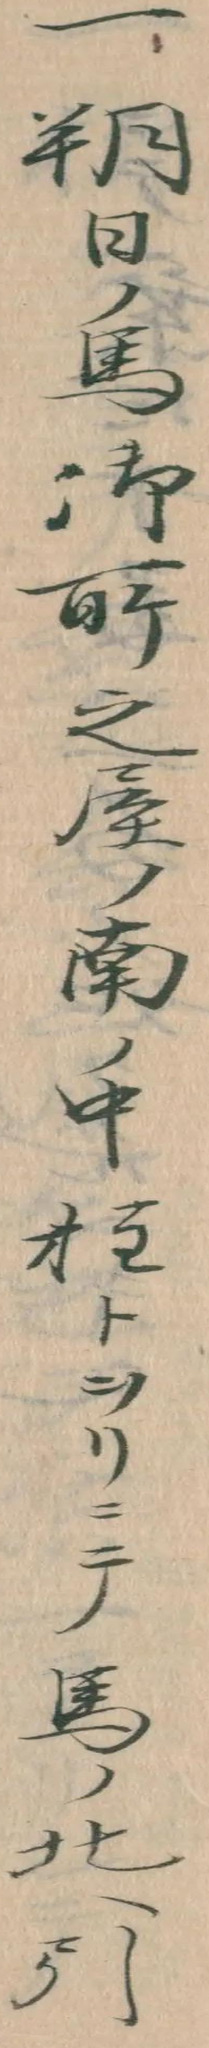一朔日ノ馬御所之屋ノ南ノ中柱トヲリニテ馬ノ北へ引
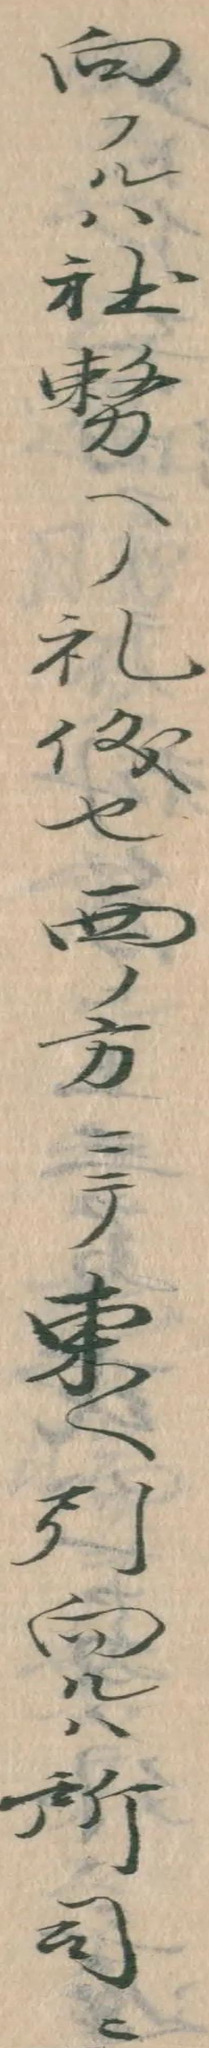向フルハ社務へノ礼儀也西ノ方ニテ東へ引向ルハ所司ニ
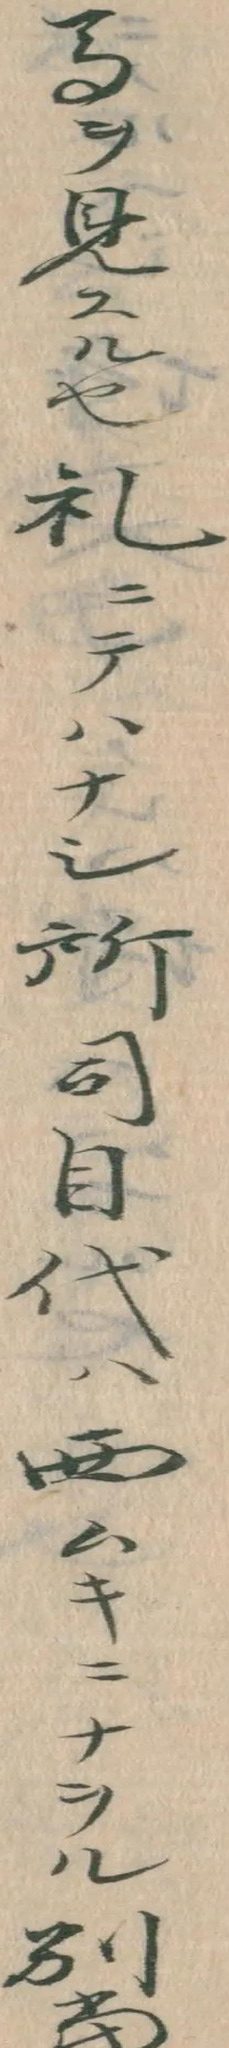馬ヲ見スル也礼ニテハナシ所司目代ハ西ムキニナヲル別当
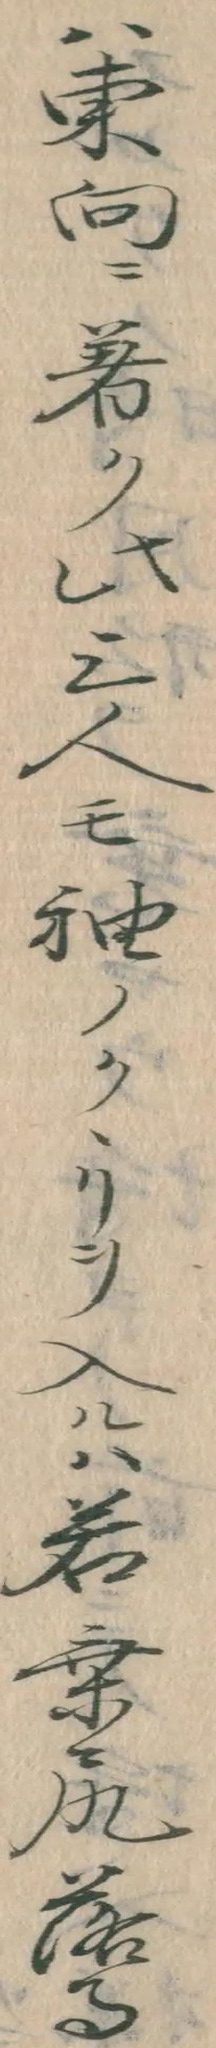ハ東向ニ着ク此三人モ袖ノクヽリヲ入ルハ若乗尻落る
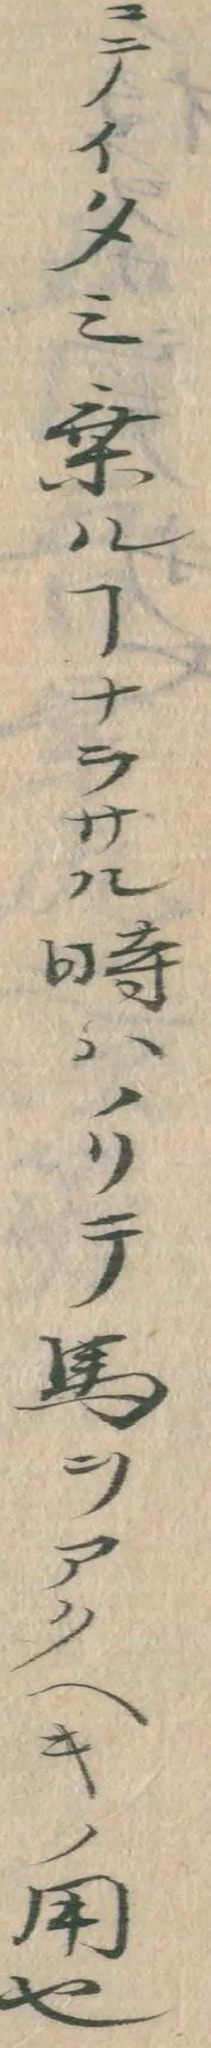ニテイタミ乗ルコトナラサル時ハノリテ馬ヲアクヘキノ用也
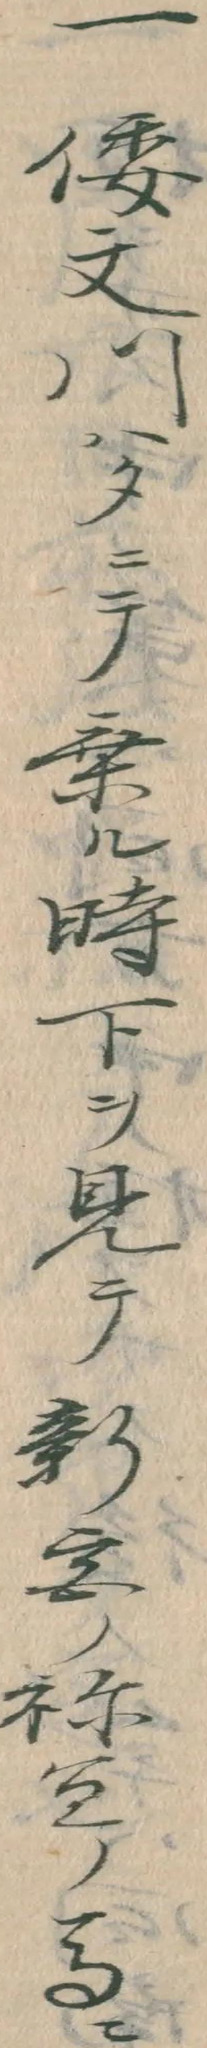一倭文川ハタニテ乗ル時下ヲ見テ新宮ノ禰宜ノ馬ニ
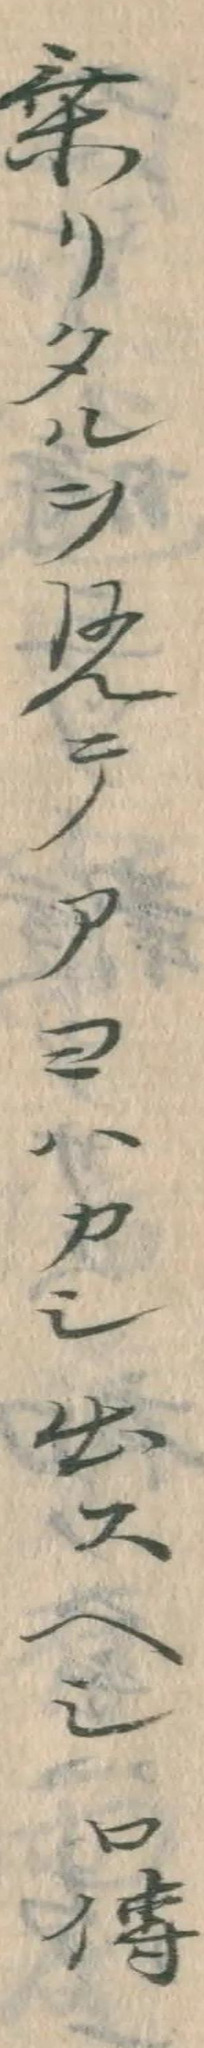乗リタルヲ見テアヨハカシ出スヘシロ伝
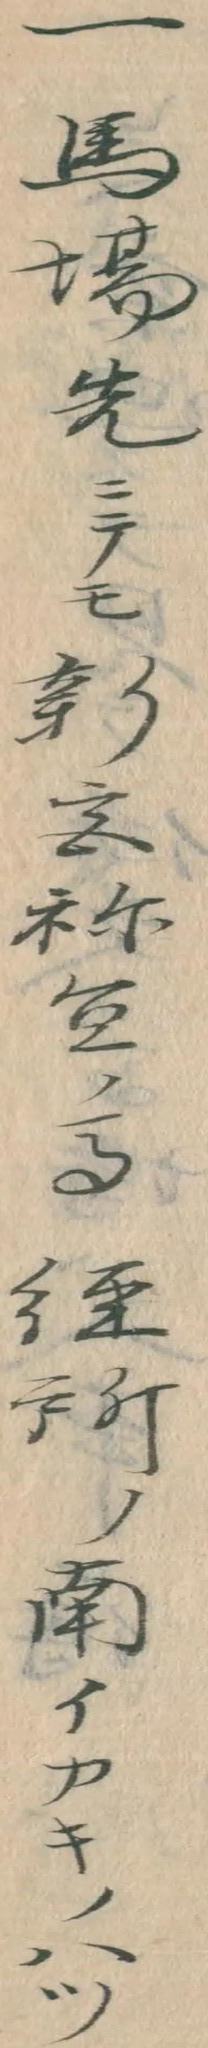一馬場先ニテモ新宮禰宜ノ馬経所ノ南イカキノハツ

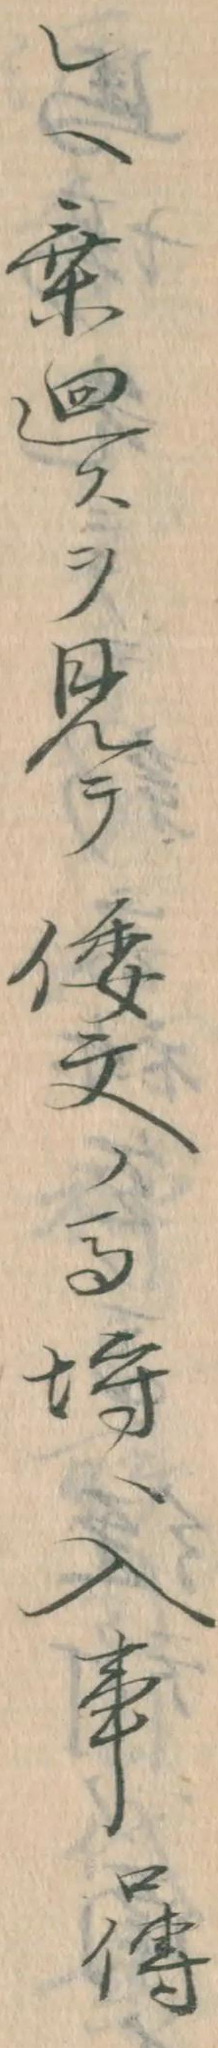レヘ乗廻スヲ見テ倭文ノ馬埒へ入事口伝
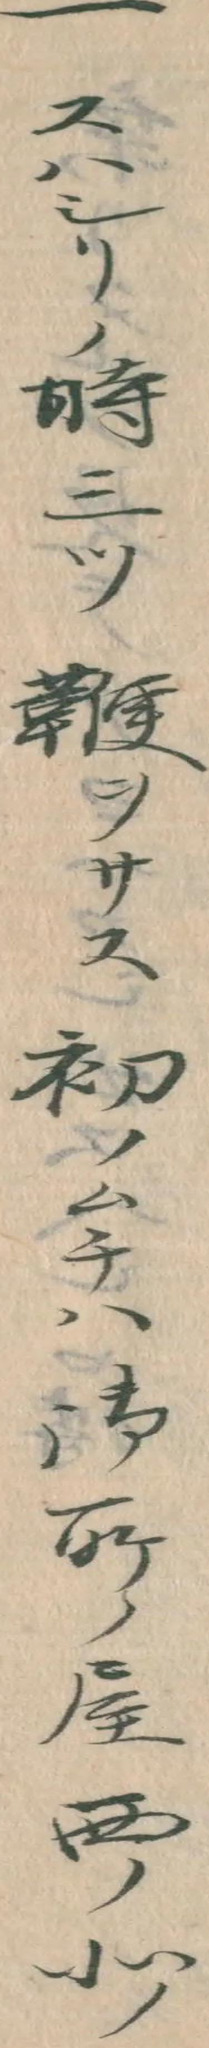一スハシリノ時三ツ鞭ヲサス初ノムチハ御所ノ屋西ノ北ノ
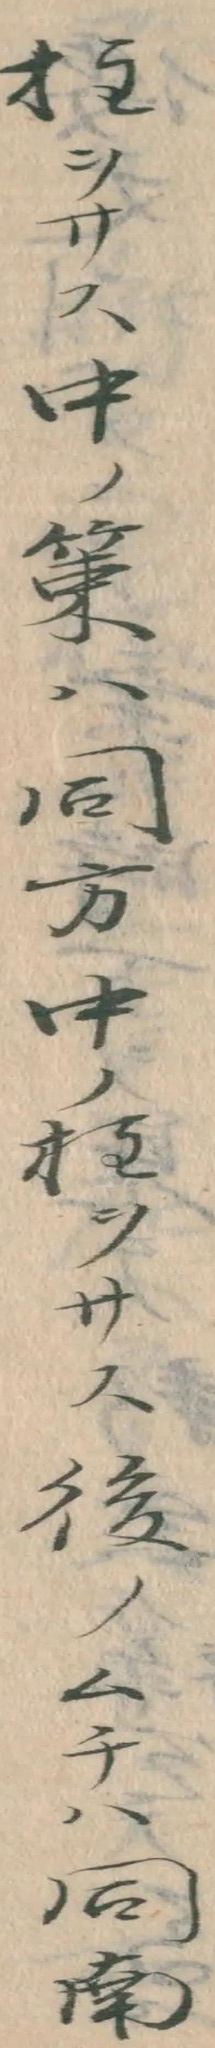柱ヲサス中ノ策ハ同方中ノ柱ヲサス後ノムチハ同南
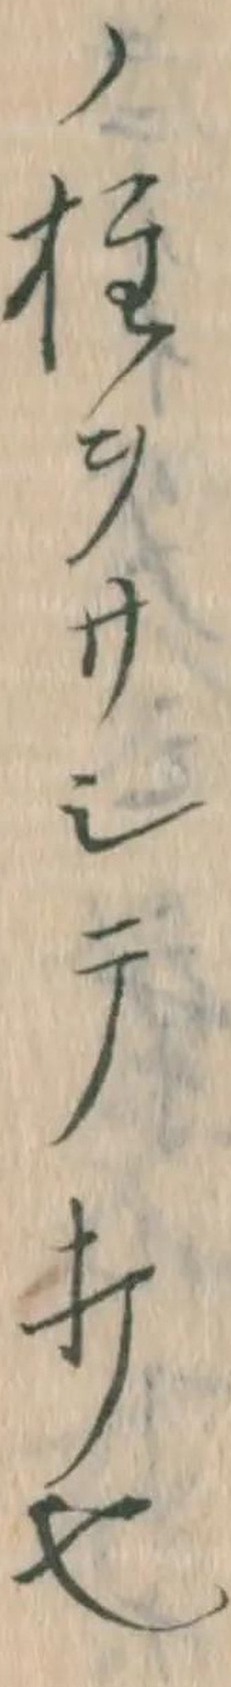ノ柱ヲサシテ打也
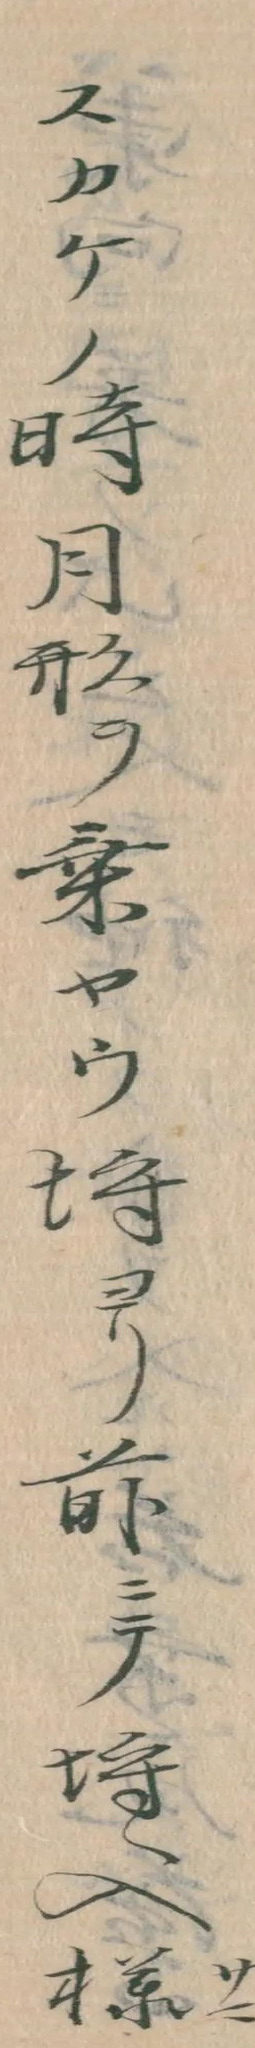一スカケノ時月形ヲ乗ヤウ埒ヨリ前ニテ埒へ入様
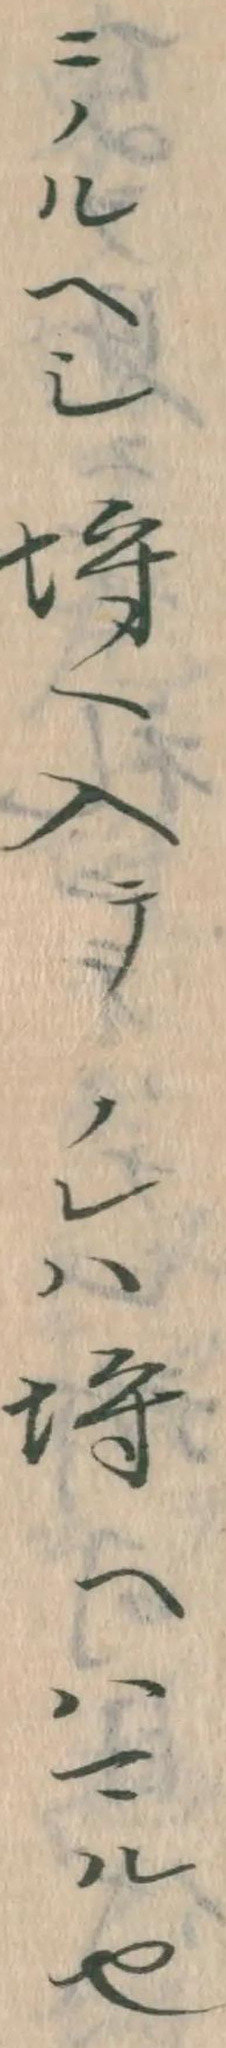ニノルヘシ埒ヘ入テノレハ埒ヘハマル也
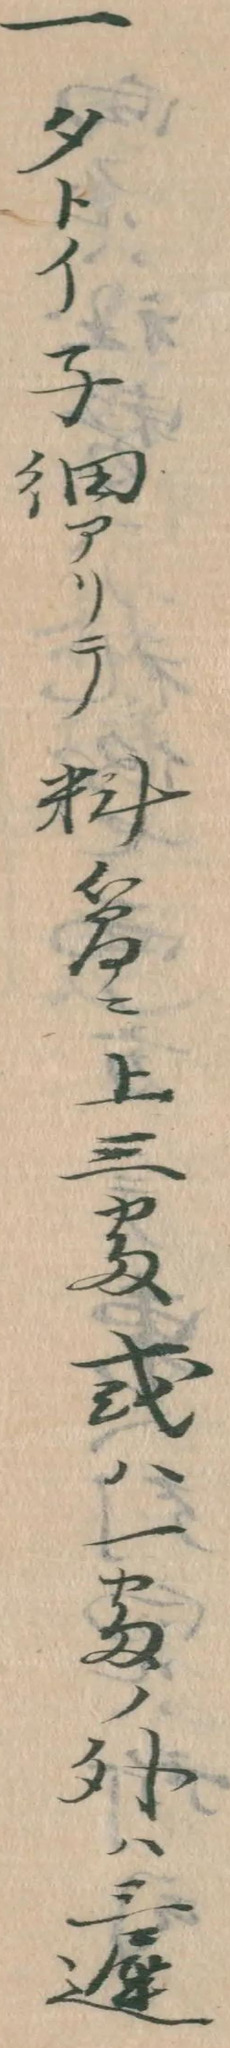一タトイ子細アリテ料簡ニ上三番或ハ一番ノ外ハ三遅
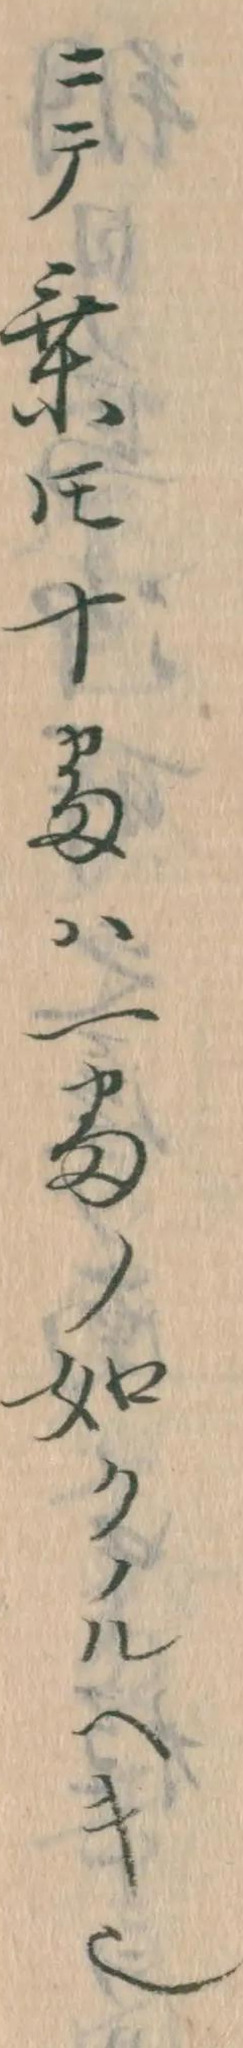ニテ乗トモ十番ハ一番ノ如クルヘキ也
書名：賀茂社記録. 第11冊
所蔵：国立国会図書館 National Diet Library, JAPAN
